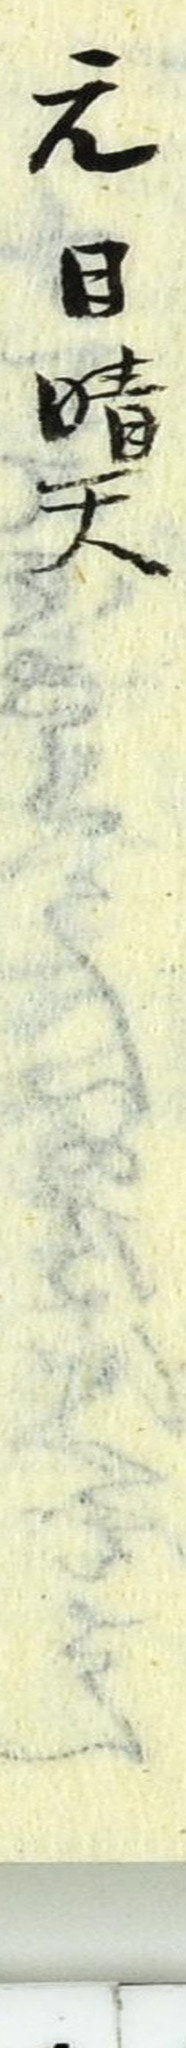元日晴天
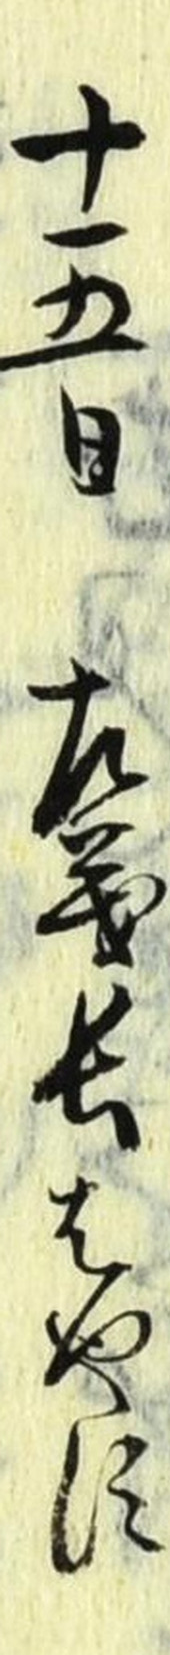十五日左義長はやす
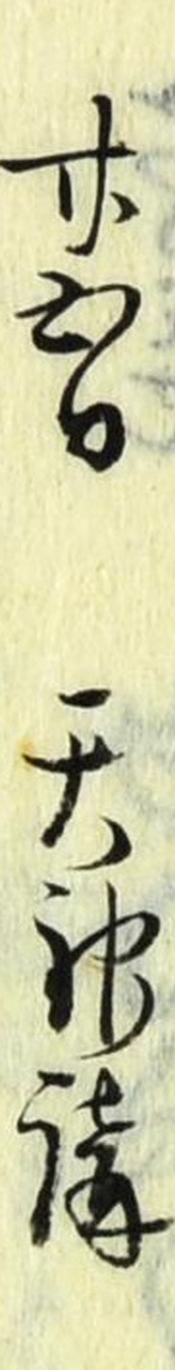廿五日天神講
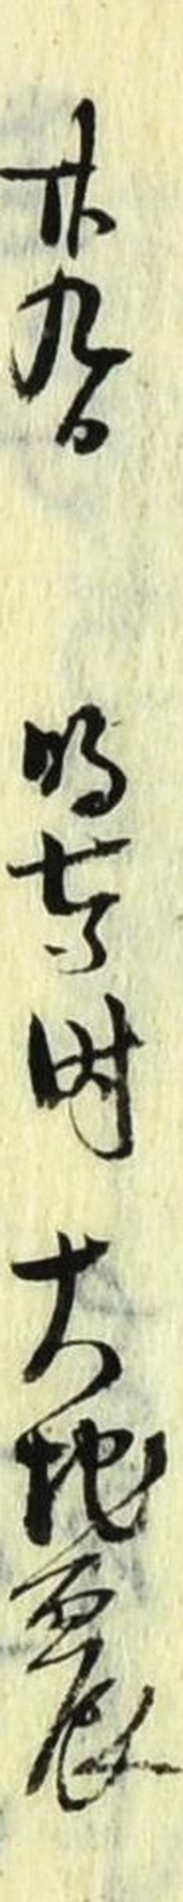廿九日明七ツ時大地震
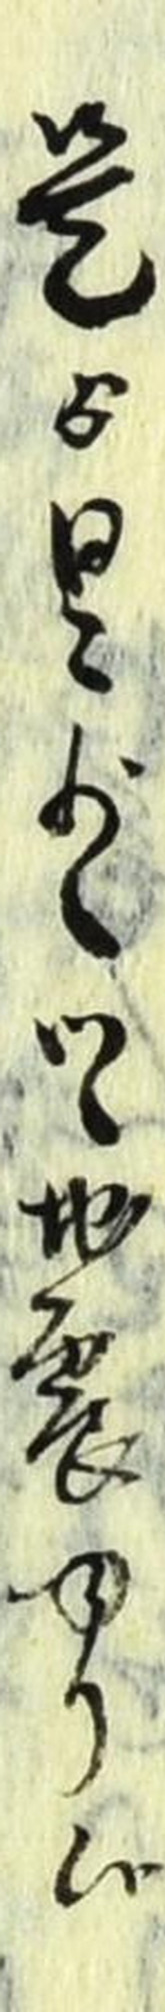是ゟ日々少々ツヽ地震ゆり候
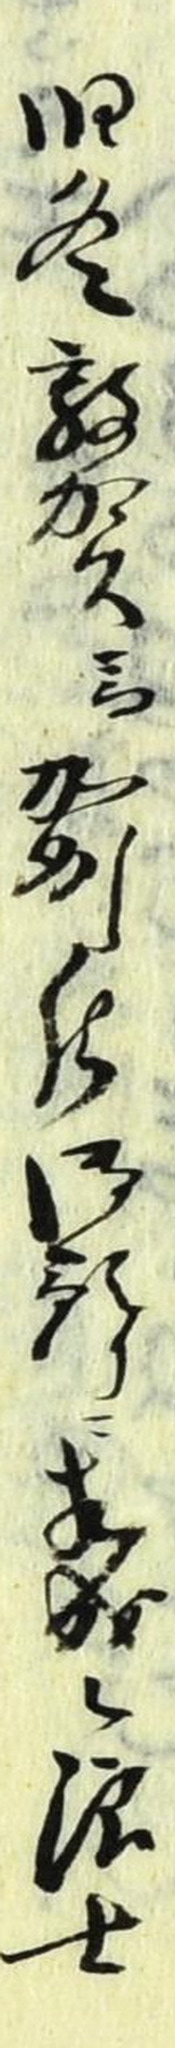旧冬敦賀に而加州侯御預り相成候浪士
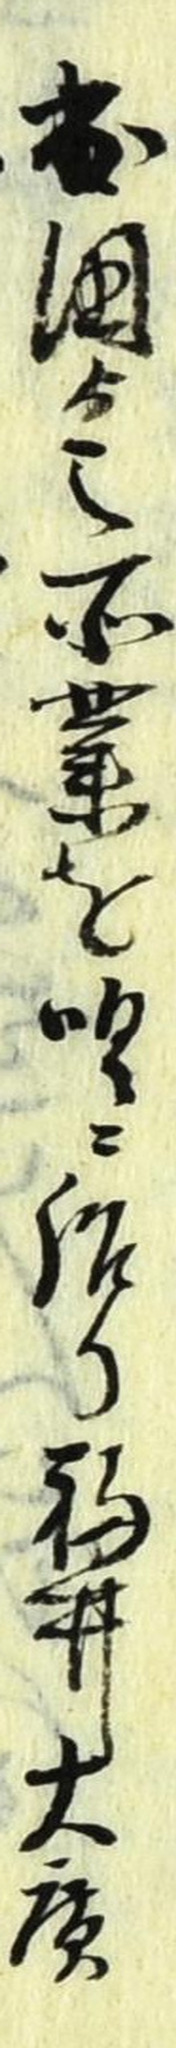出国ゟ之所業を唄に作り福井大広
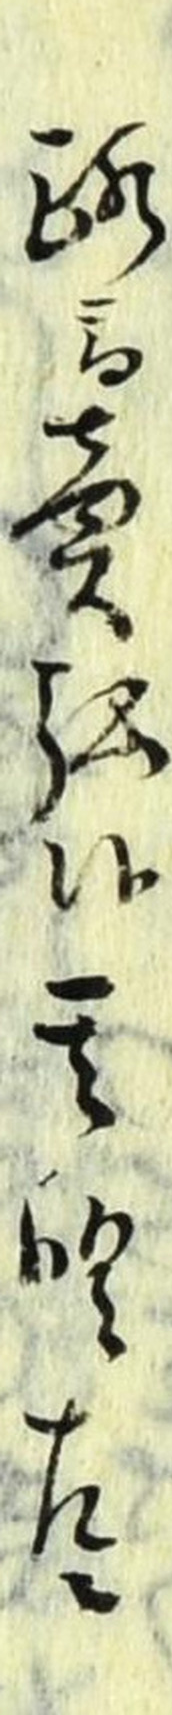路に而売弘候其唄左に
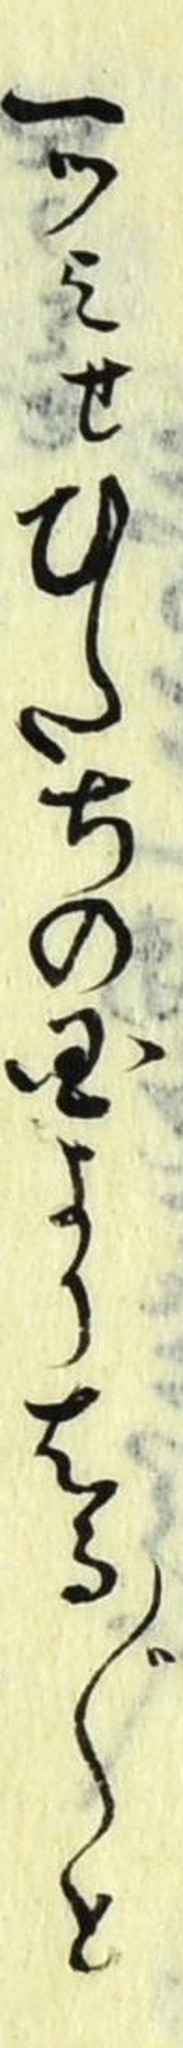一ツとせひたちの国よりはる〴〵と
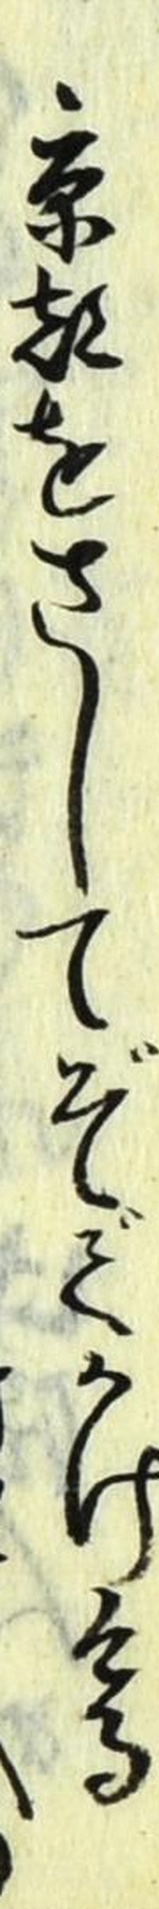京都をさしてぞでかけける
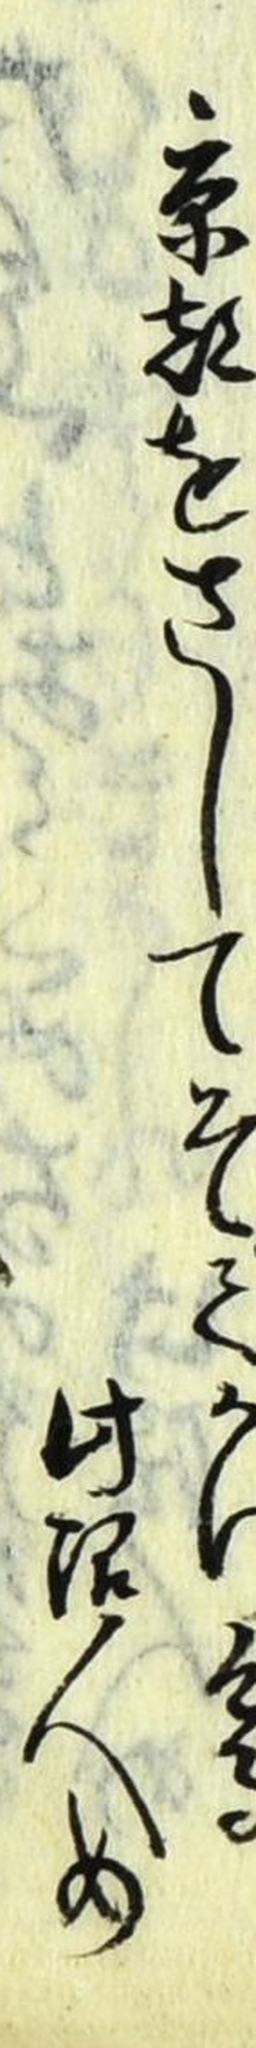此浪人め
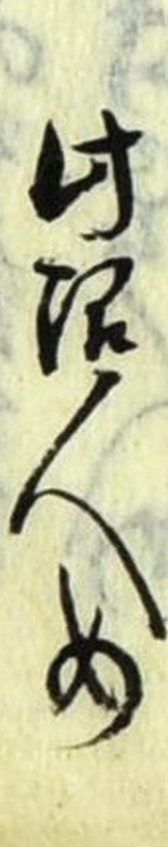此浪人め
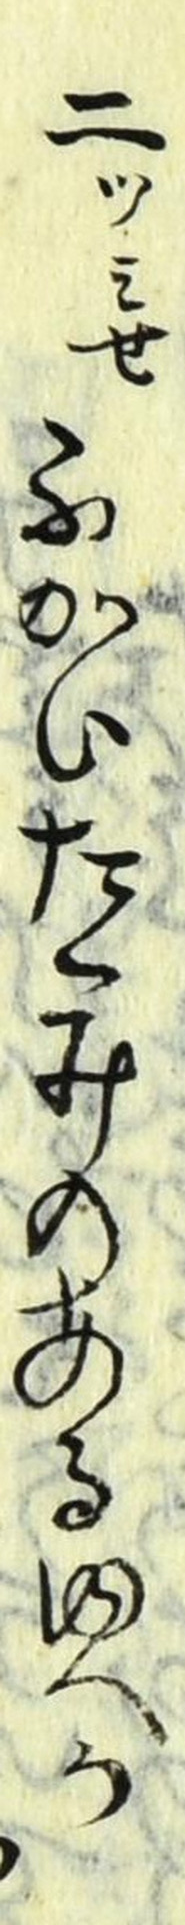二ツとせふかいたくみのあるゆへか
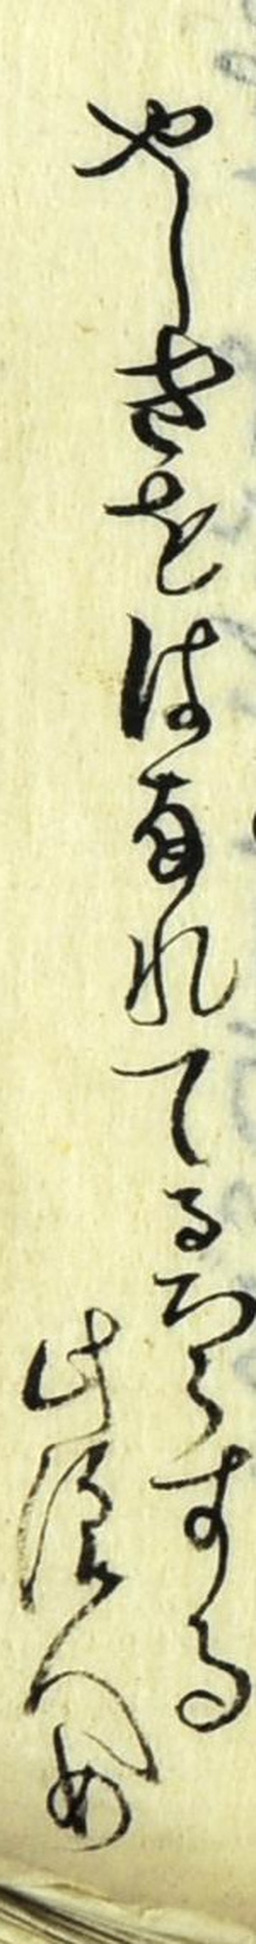やしきをはなれてるろうする
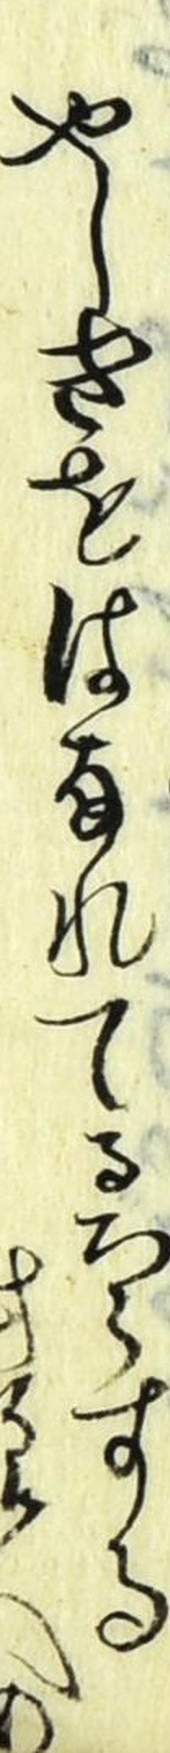やしきをはなれてるろうする
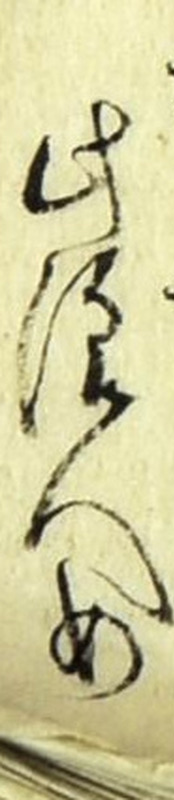此浪人め
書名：（日記）
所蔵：福井県文書館 Fukui Prefectural Archives
